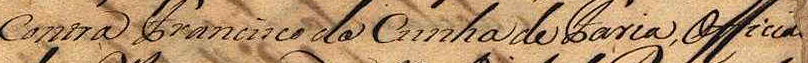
contra Francisco da Cunha Faria, officia
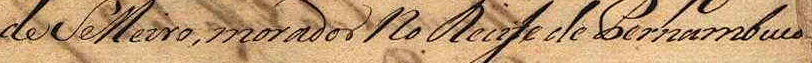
de selleiro, morador no Recife de Pernambuco
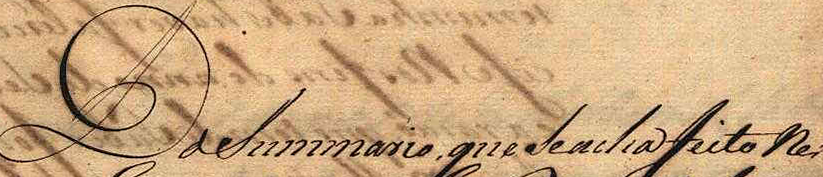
Do Summario, que se acha feito nes
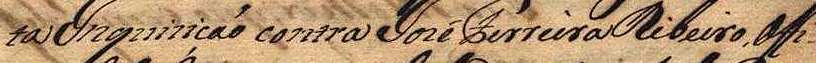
ta Inquizição contra Iosé Ferreira Ribeiro, Offi
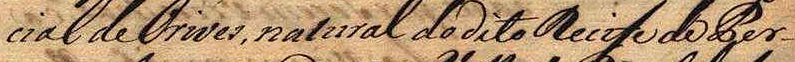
cial de Orives, natural do dito Recife de Per
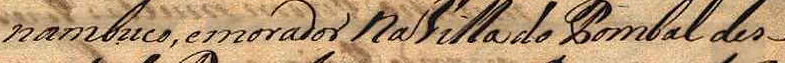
nambuco, e morador na Villa do Pombal des
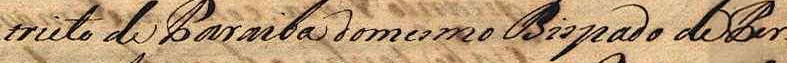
tricto de Paraiba do mesmo Bispado de Per
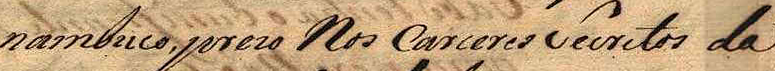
nambuco, prezo Nos carceres secretos da
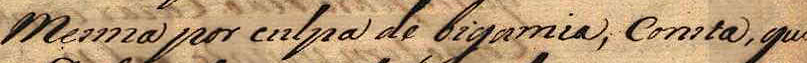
Mesma por culpa de bigamia, consta, que
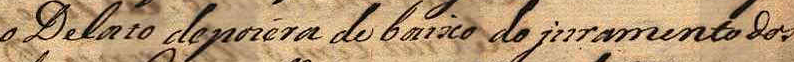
o Delato depozera debaixo do juramento dos
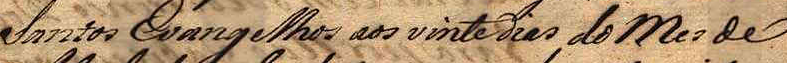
Santos Evangelhos aos vinte dias, do Mes de
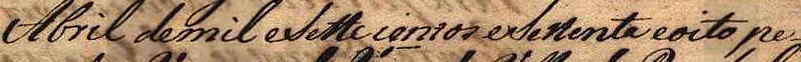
Abril de mil e Settecentos e Sessenta e oito pe
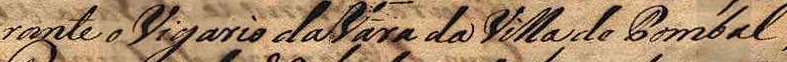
rante o Vigario da Vara da Villa de Pombal,
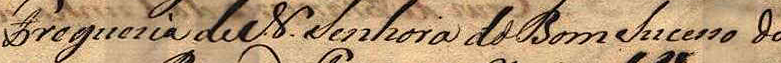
Freguezia de N. Senhota do Bom Sucesso do
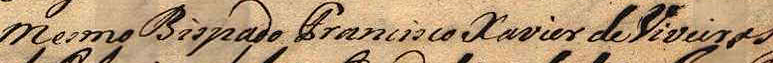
Mesmo Bispado Francisco Xavier de Viveiros
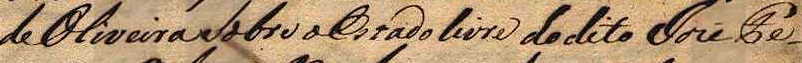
de Oliveira sobre o Estado livre do dito Iozé Fe
